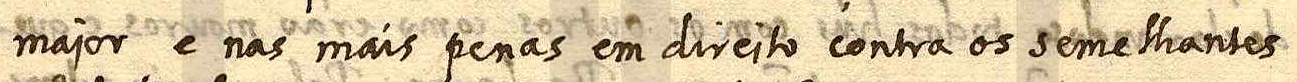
major e nas mais penas em direito contra os semelhantes
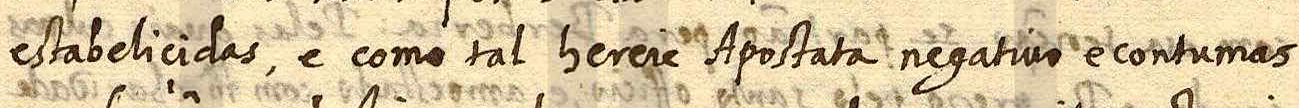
estabelicidas, E como tal hereie Apostata negatiuo e contumas
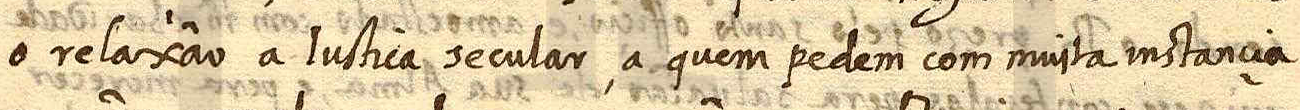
o relaxaõ a Iustica secular, a quem pedem com mujta instançia
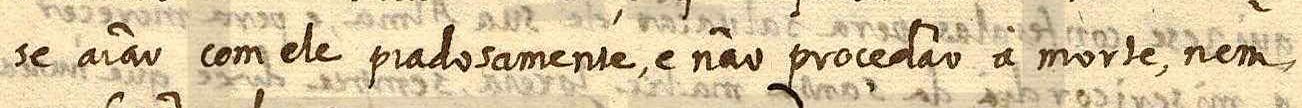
se aião com ele piadosamente, e nao proçedão a morte, nem,
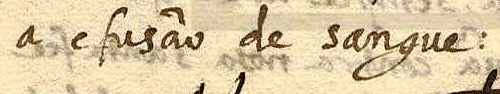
a efusão de sangue:
